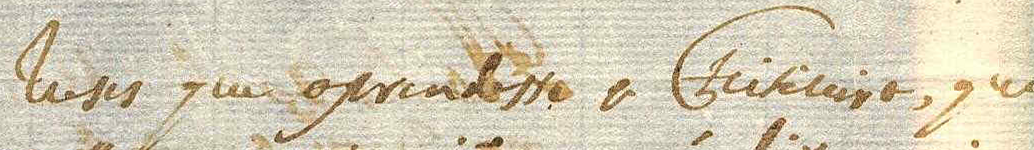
veses que aprendesse o Feiticeiro, que
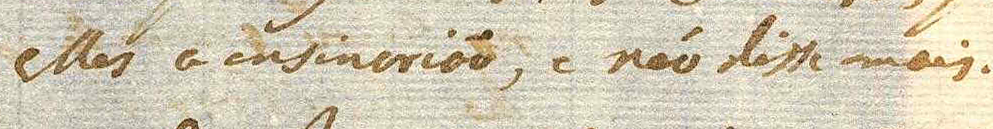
elles a ensinarião, e naõ disse mais.
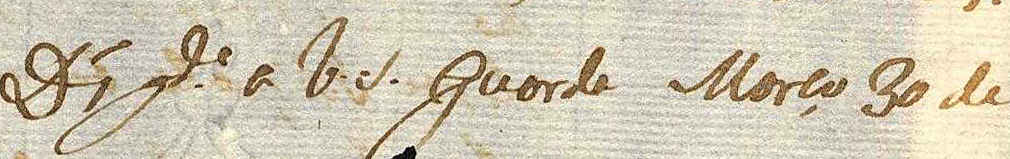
Ds̄ gd.e a V. S. Guarda Março 30 de
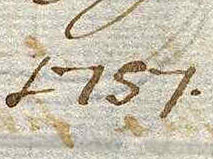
1757.
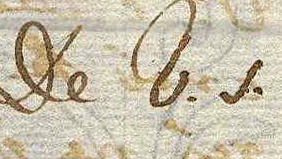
De V. S.
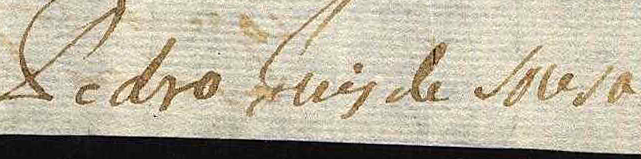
Pedro Luis de sousa
